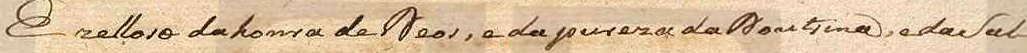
E zelloso da honra de Deos, e da pureza da Doutrina, e da Sal
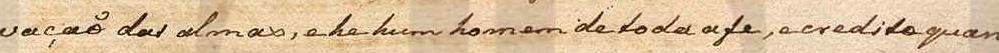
vaçaõ das almas, e he hum homem de toda a fe, e acredita quan
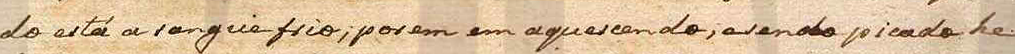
do está a sangue frio; porem em aquescendo, e sendo picado he
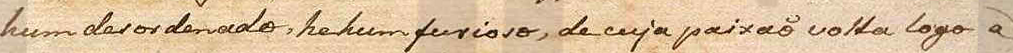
hum desordenado, he hum furioso, de cuja paixaõ volta logo a
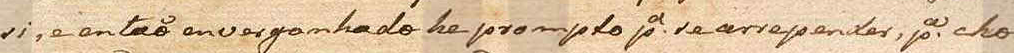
si, e entaõ envergonhado he prompto p.a se arrepender, p.a cho
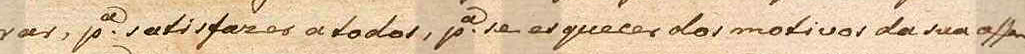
rar, p.a satisfazer a todos, p.a se esquecer dos motivos da sua offen
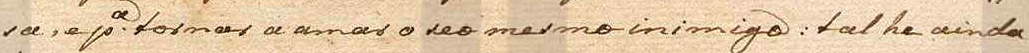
sa, e p.a tornar a amar o seo mesmo inimigo: tal he ainda
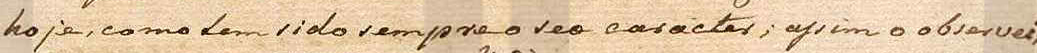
hoje, como tem sido sempre o seo caracter; assim o observei,
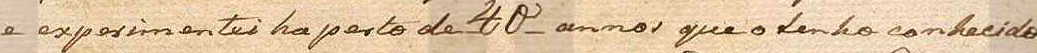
e experimentei ha perto de - 40 annos - que o tenho conhecido
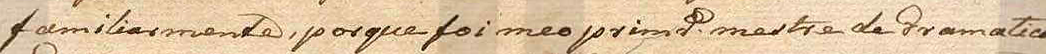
familiarmente, porque foi meo primeir.o mestre de Gramatica
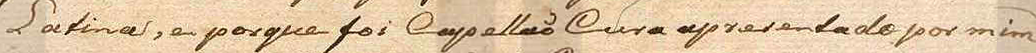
Latina, e porque foi Capellaõ Cura apresentado por mim
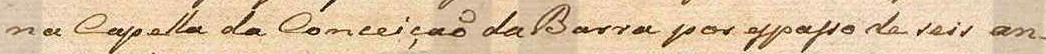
na Capella da Conceiçaõ da Barra por espasso de seis an
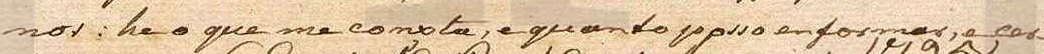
nos: he o que me consta. E quanto posso enformar, e cer
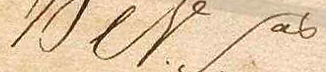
De V. S.as
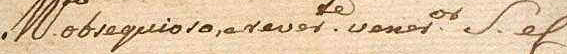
M.to obsequioso, e rever.te vener.or S. e C
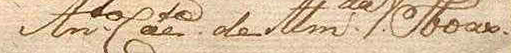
An.to Caeto. de Alm.da V.a Boas
